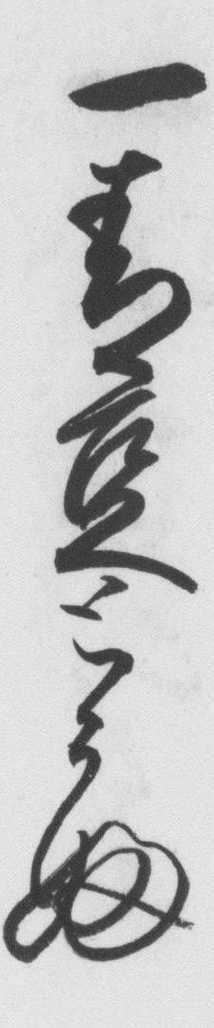一青豆とうふ
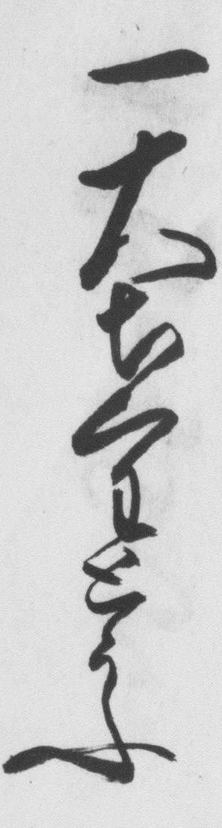一大ちくわとうふ

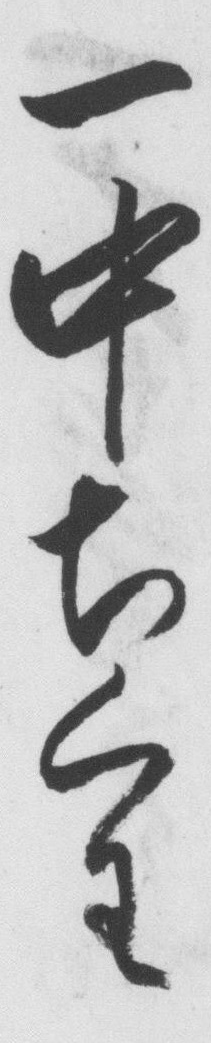一中ちくわ
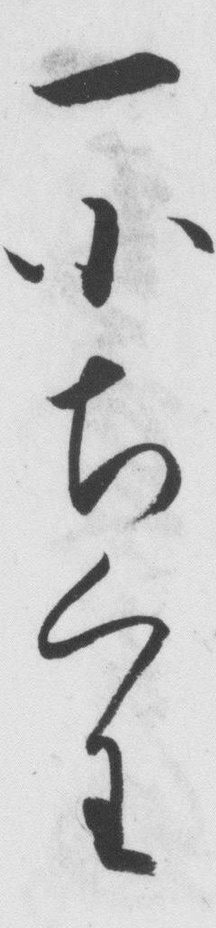一小ちくわ
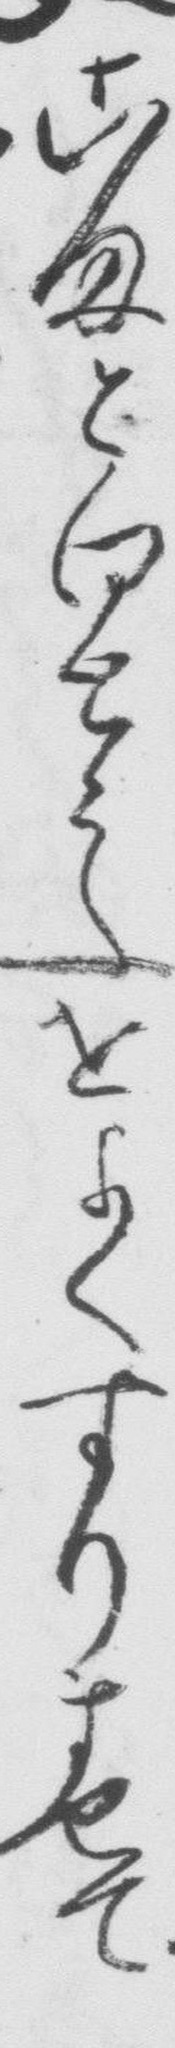こまと白とうふをよくすりませて
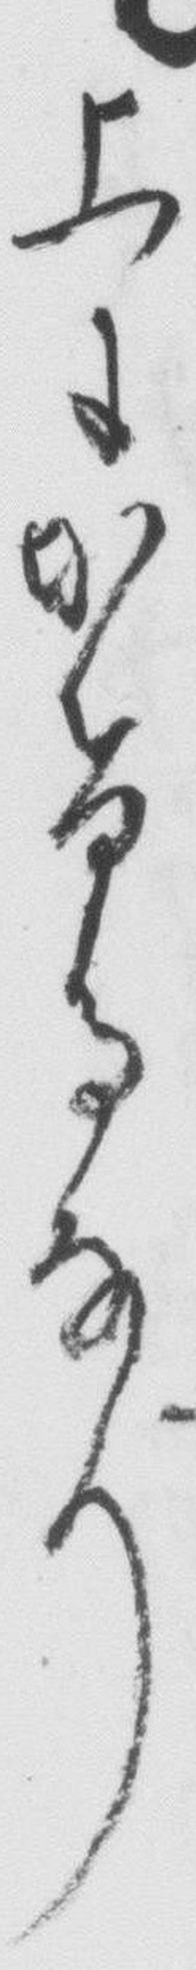上にかけるなり
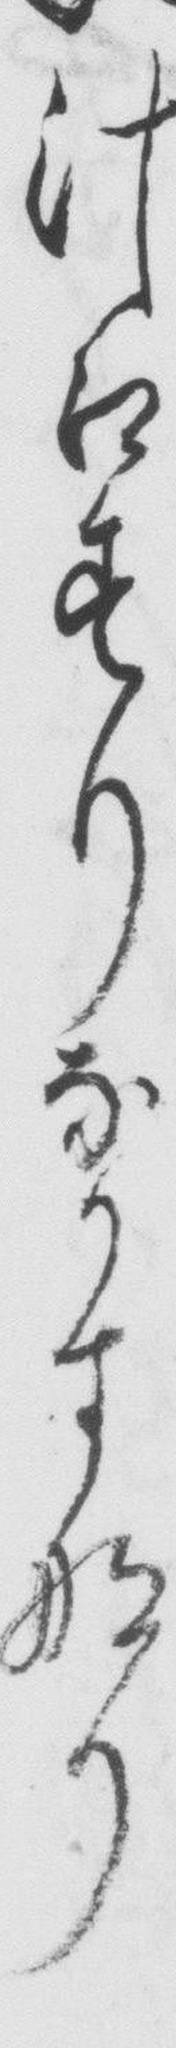汁すりなかすなり
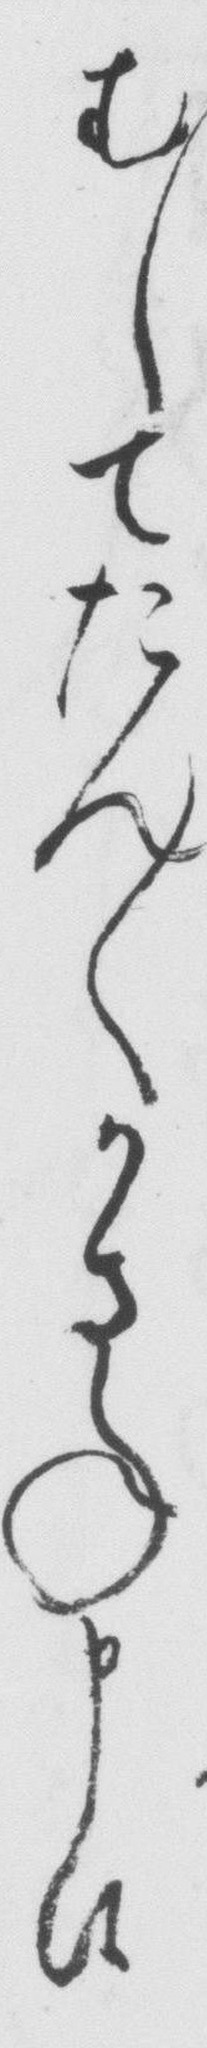むしてたん〳〵かさね
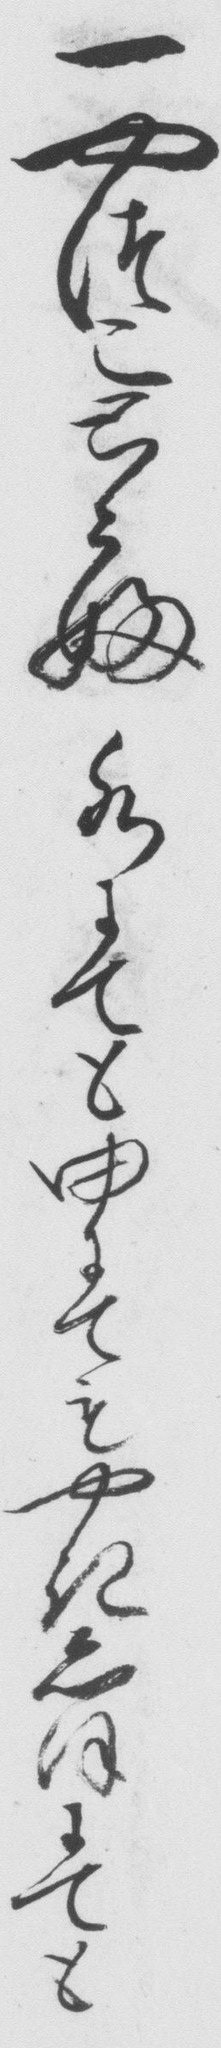一やつことうふ水にてもゆにてもやきしほにても
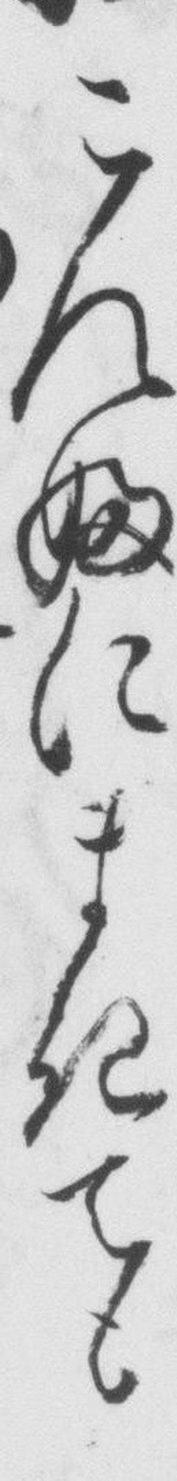こんふにまきても切
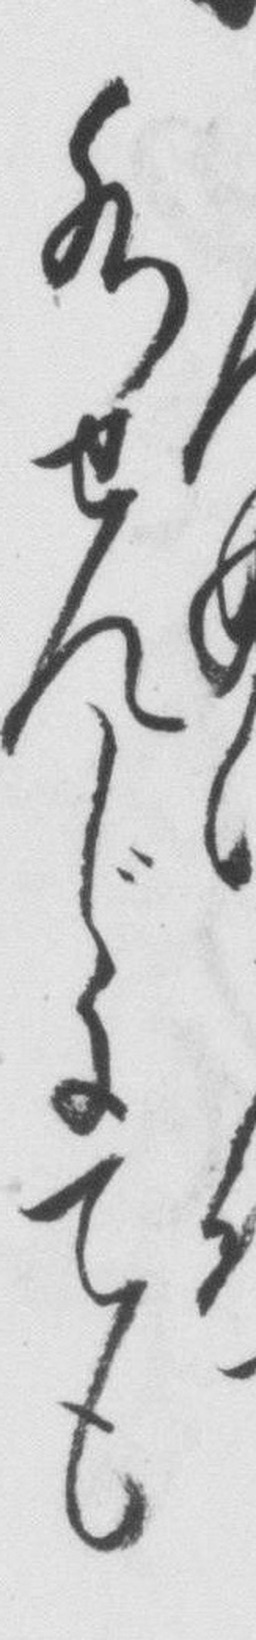水せんじにても
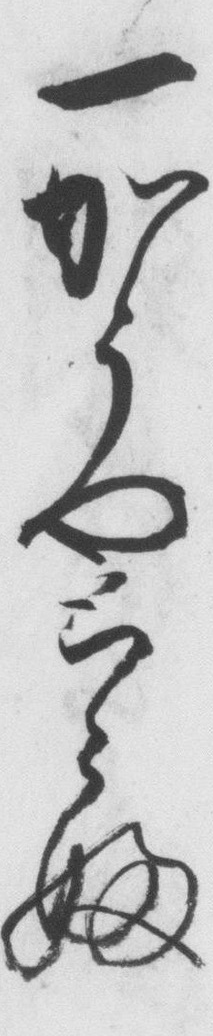一かうやとうふ

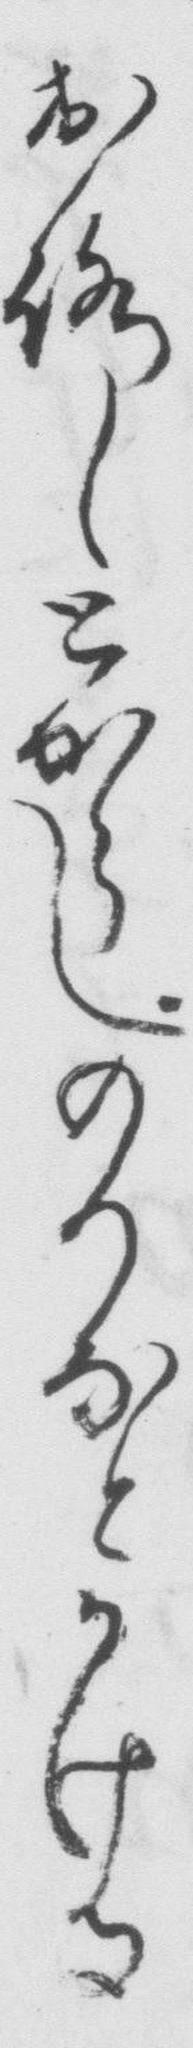おろしとからしのりなとかけて
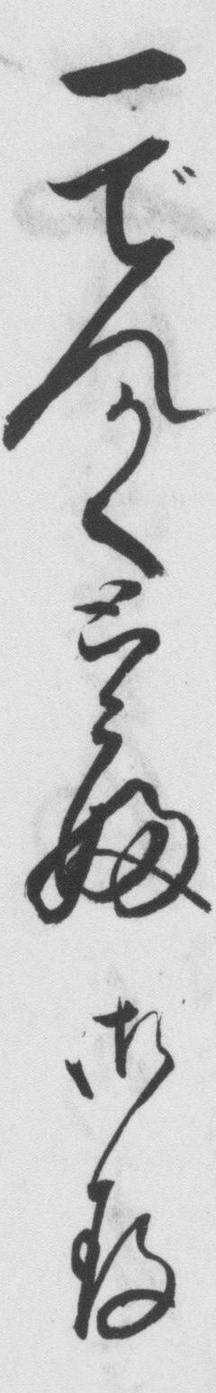一でんかくとうふ御
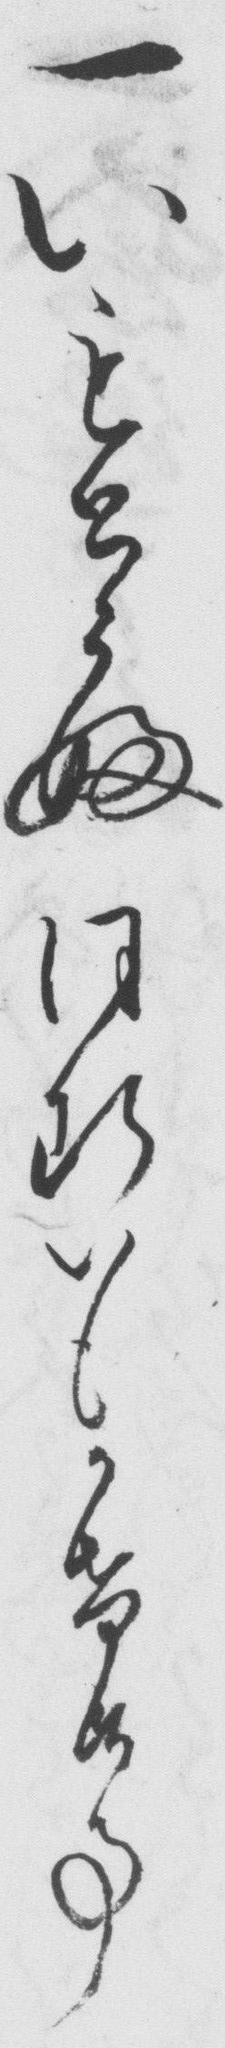一いととうふ同段いもかけ
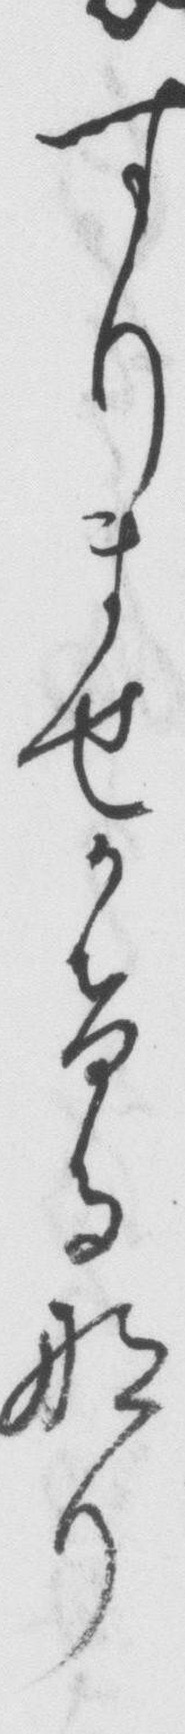すりませかけるなり
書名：料理筌
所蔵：大阪府立大学学術情報センター 国文学研究資料館
